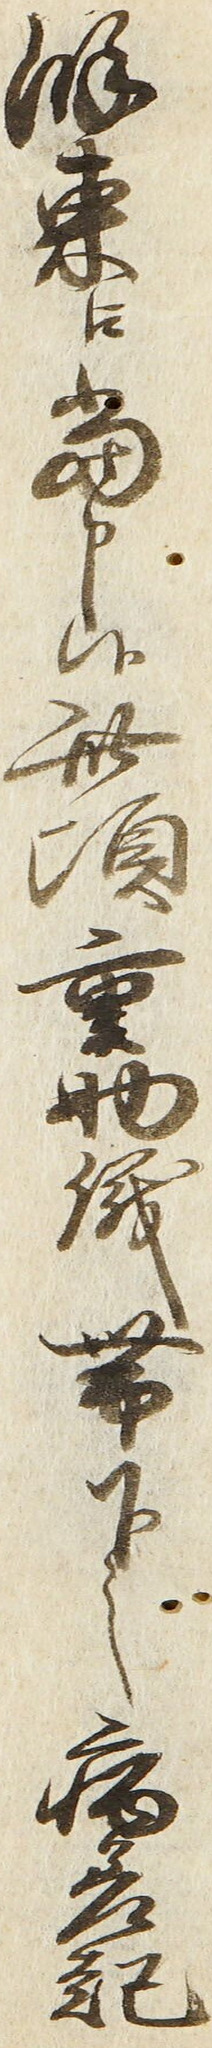餘東江當申候此頃重助儀帯下之病差起
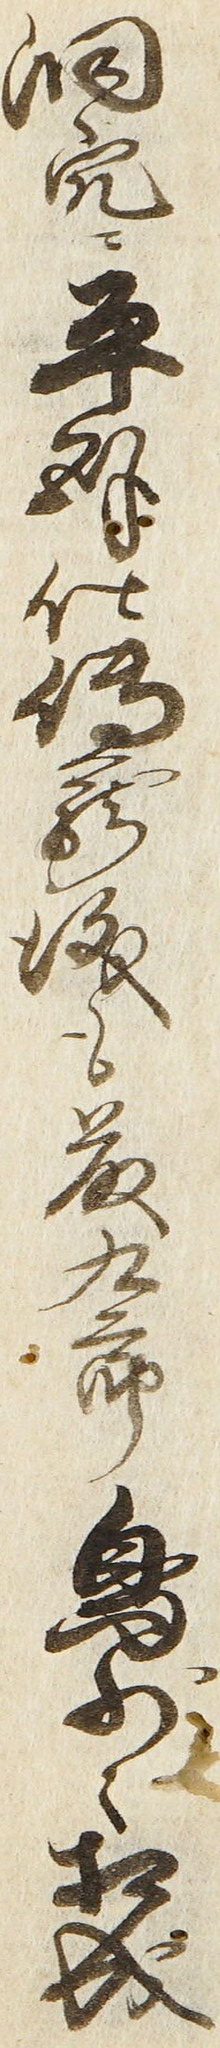洞穴ニ平臥仕傳蔵儀も藤九郎鳥少く相成
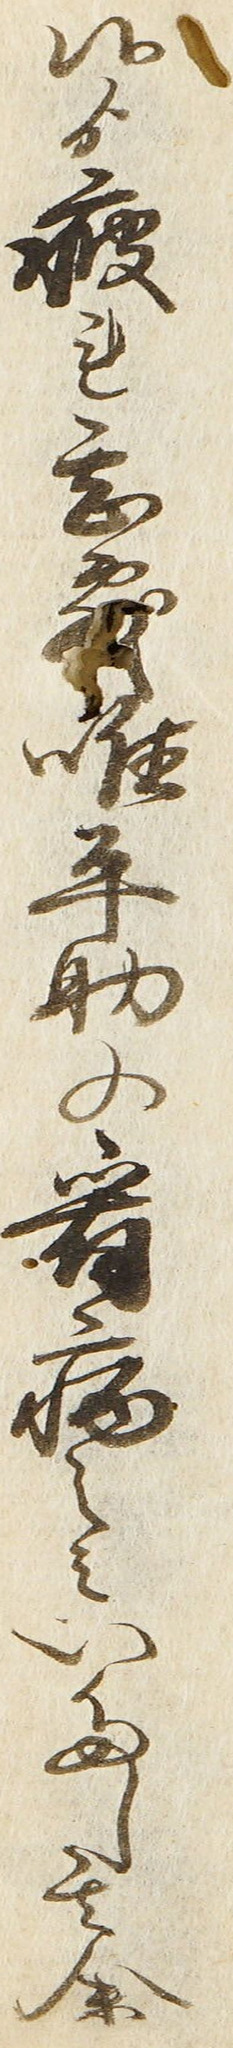候ゟ疲れ甚敷唯平助の看病のみいたし其余
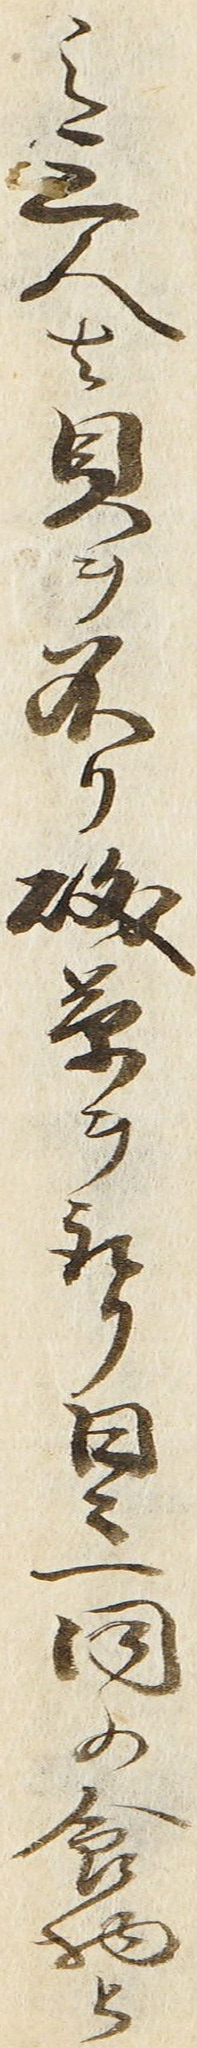之三人者貝ヲ取り磯草ヲ取り日々一同の食物と
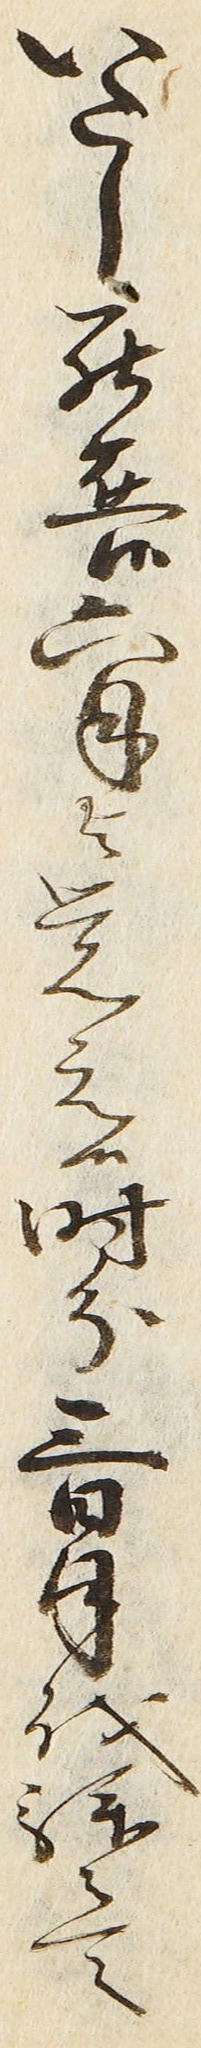いたし罷在候六月と覚え候時分三日月儀拝候て
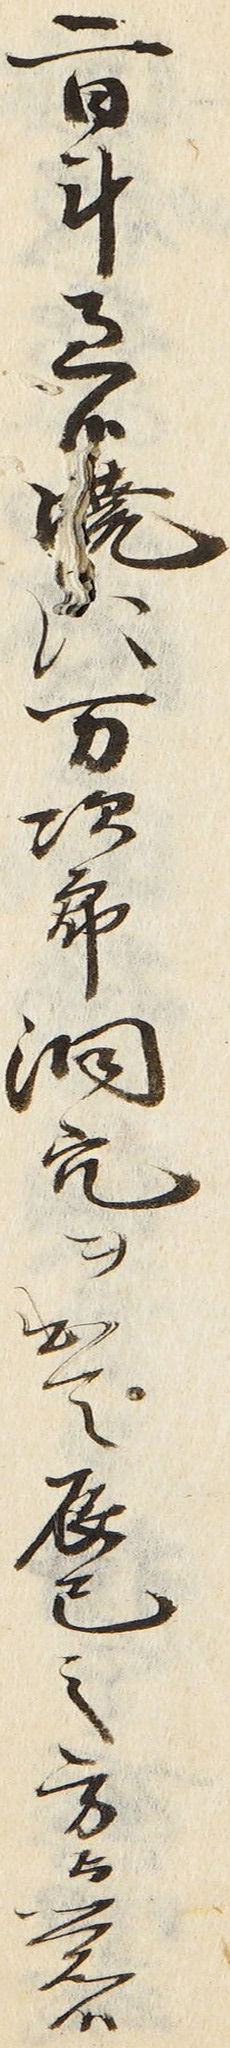二日斗過候暁に万次郎洞穴ヲ出て辰巳之方と覚候
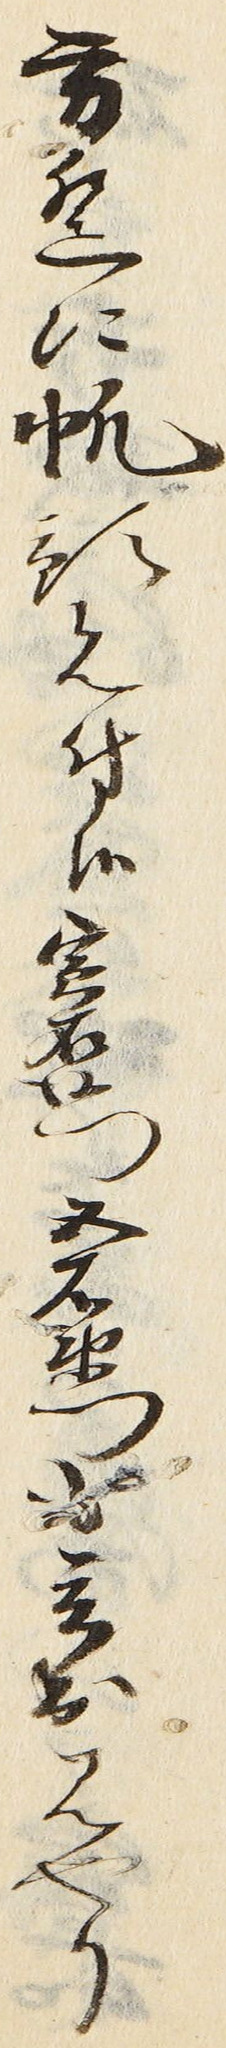方邊に帆頭見付候寅右衛門五右衛門も立出見やり
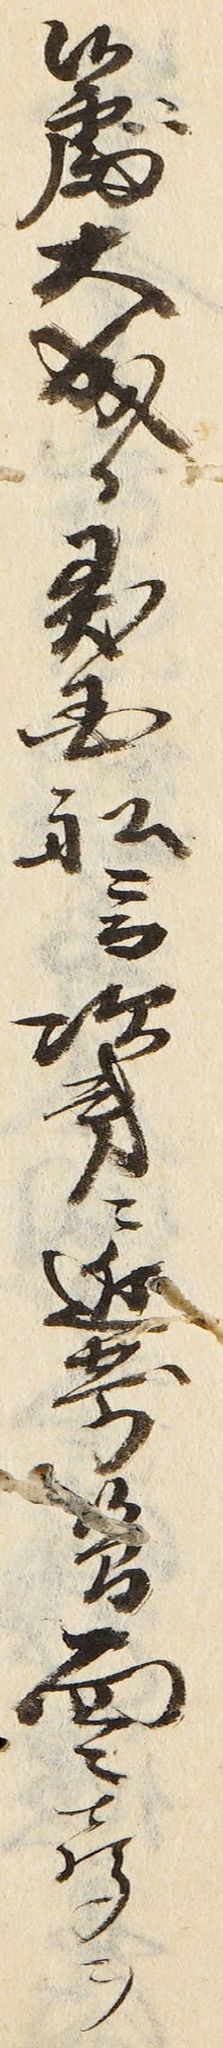候處大成候異国舩ニ而次第ニ近寄候間面々聲ヲ
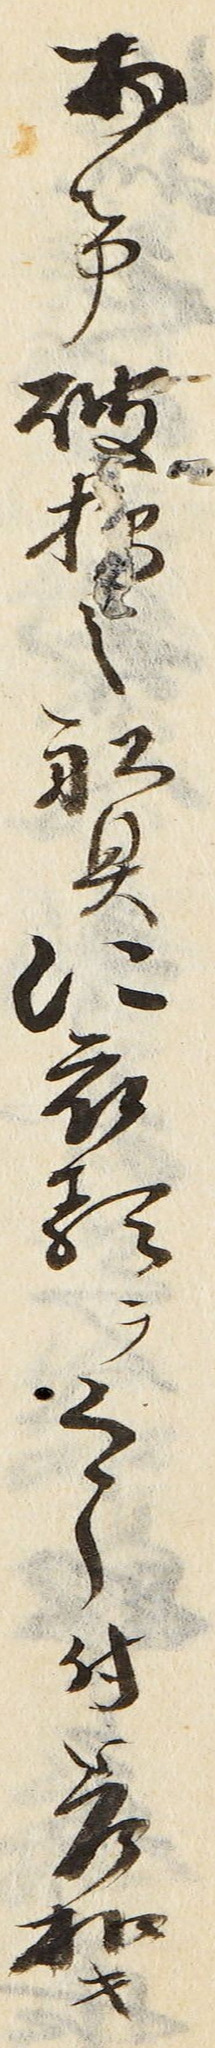あけ破損之舩具に衣類ヲくゝり付差扣キ
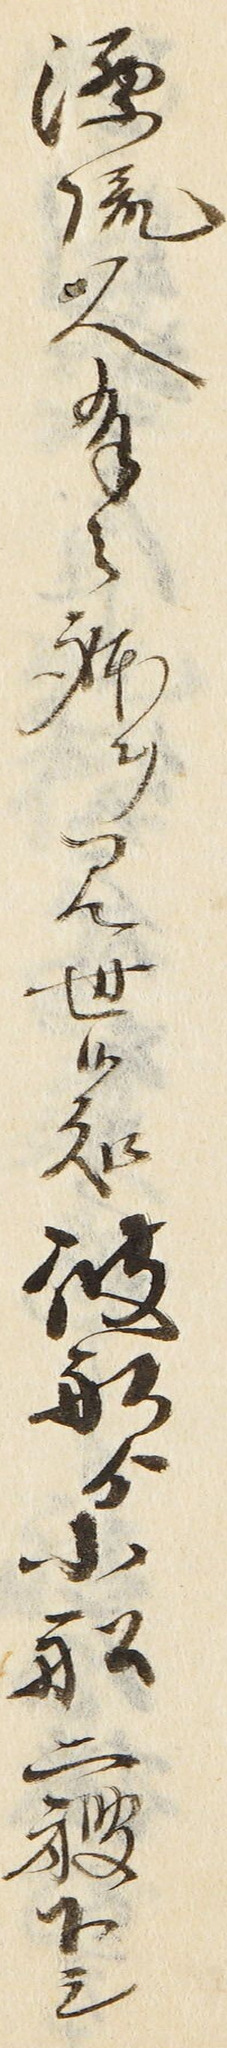漂流人有之躰ヲ見世候処彼舩ゟ小舩二艘下シ
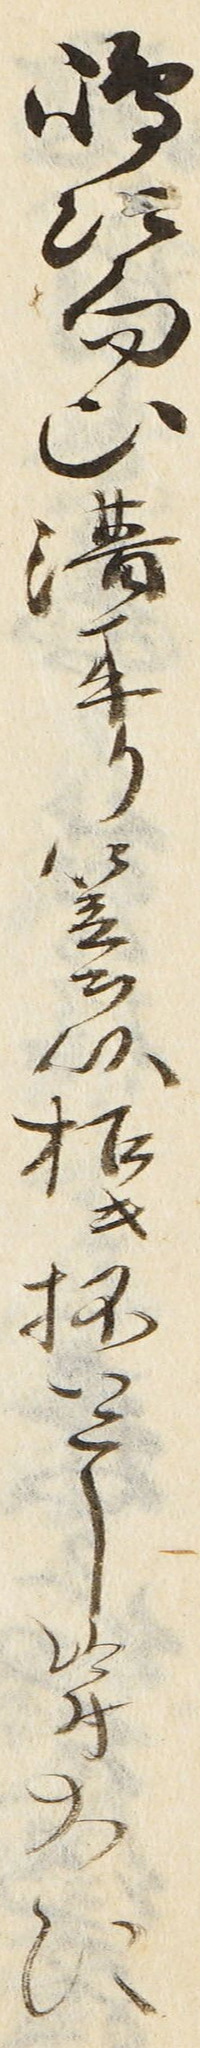嶋に向ひ漕来り笠ヲ以招キ抔いたし候ニ付大に
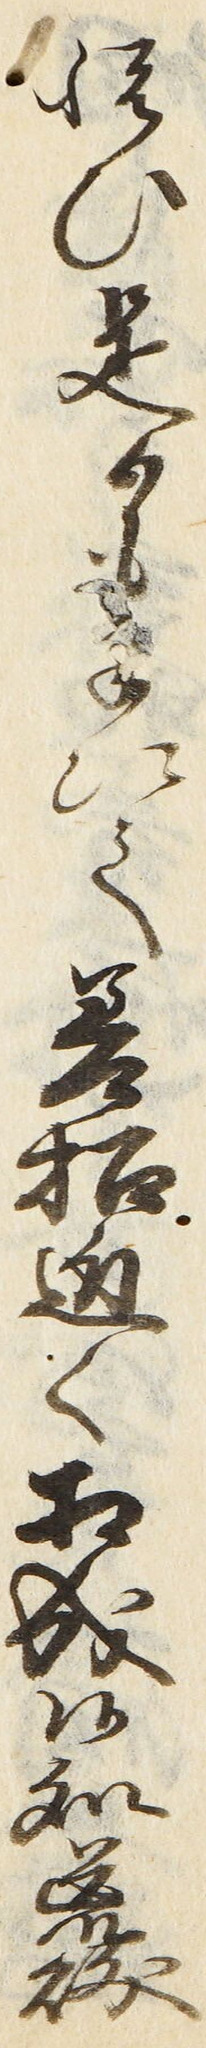悦ひ是ゟも手にて差招近く相成候処荒磯
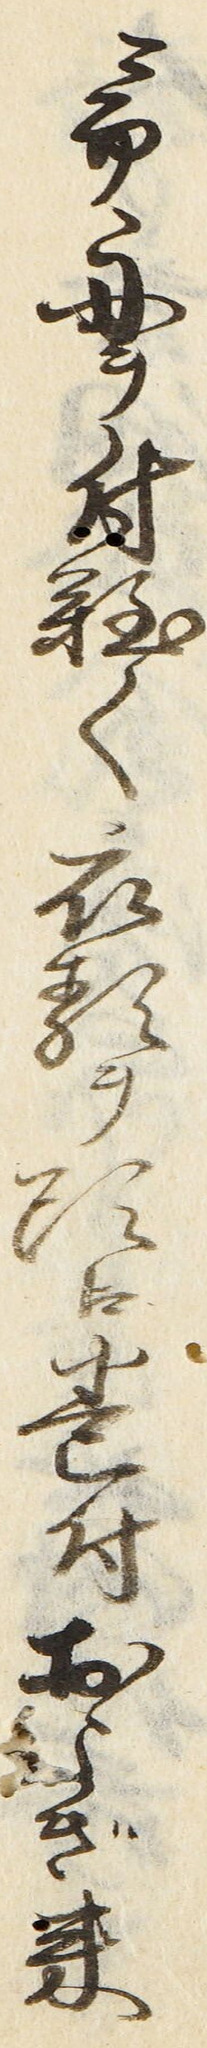ニ而舟ヲ付難く衣類ヲ頭江巻付およぎ来
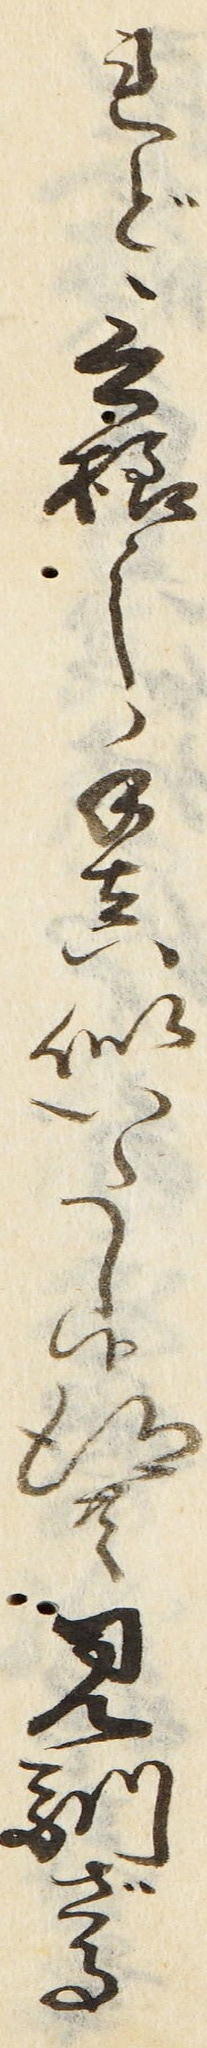れど言様之手真似いたし候得共見馴ざる
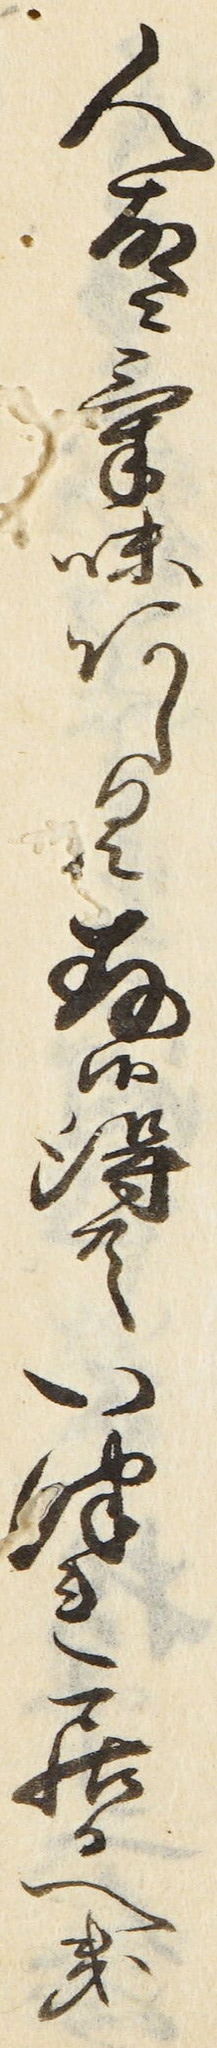人故ニ氣味あしく存候得共いつれ居るへき
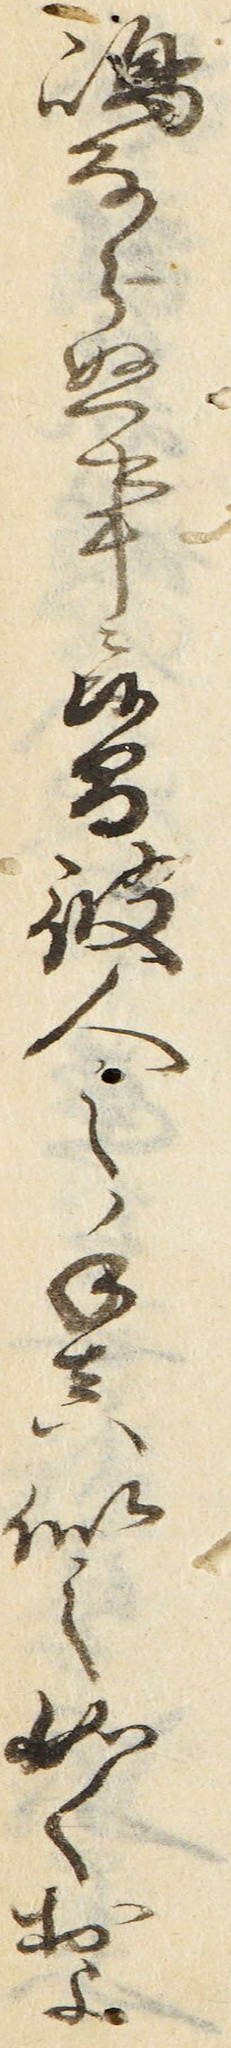嶋ならぬ事ニ候間彼人手真似之如くおよ
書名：漂客談寄
